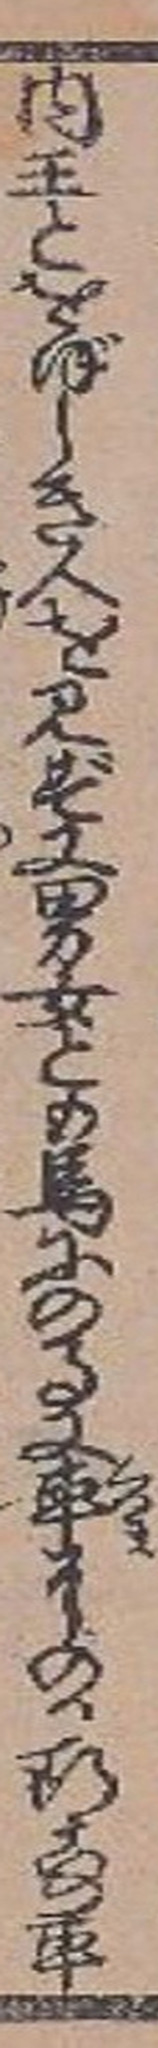内王とをぼしき人を見ず又男女とも馬にのる又車にのり行？両？車
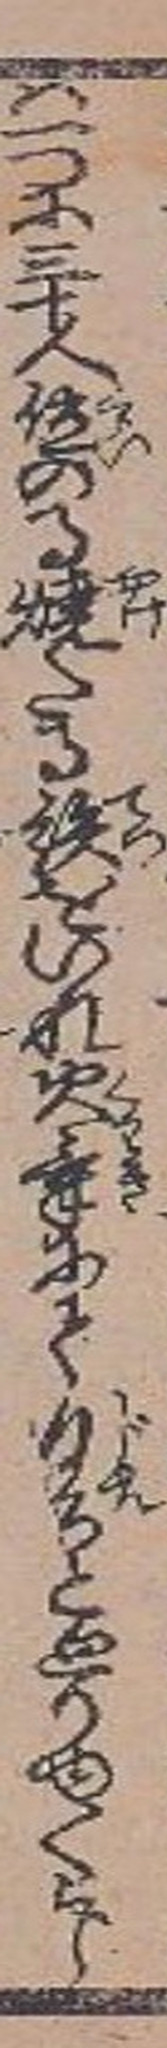は一つに三十人位のる焼たる鉄をいれ火気にて自分と廻りゆくし
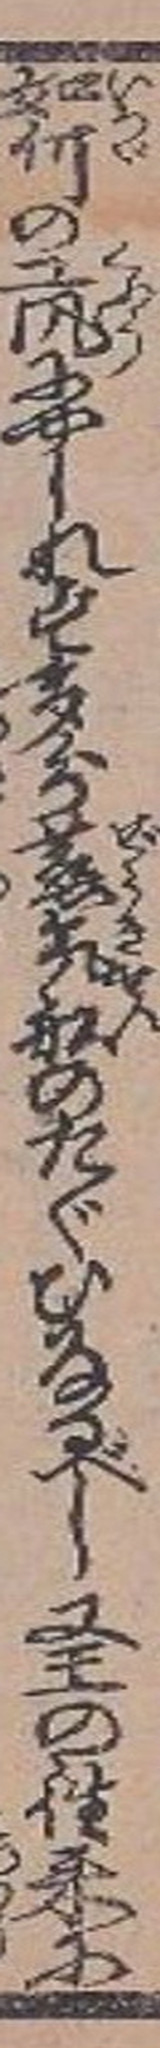如何の工風にやしれず多分蒸気船のたぐひなるべし又王の往来に
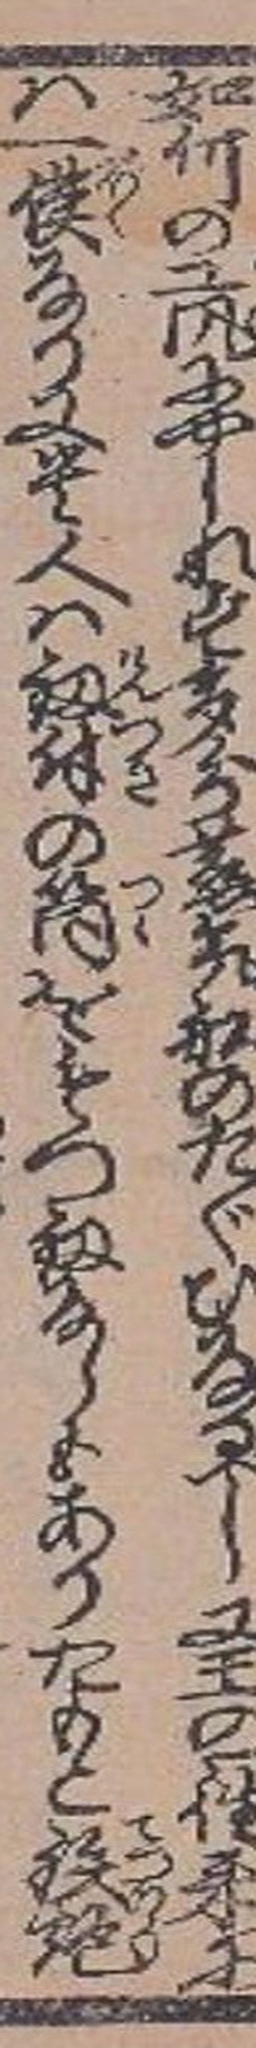は一僕なり又貴人は劔付の筒をもつ劔なしもありたもと鉄砲
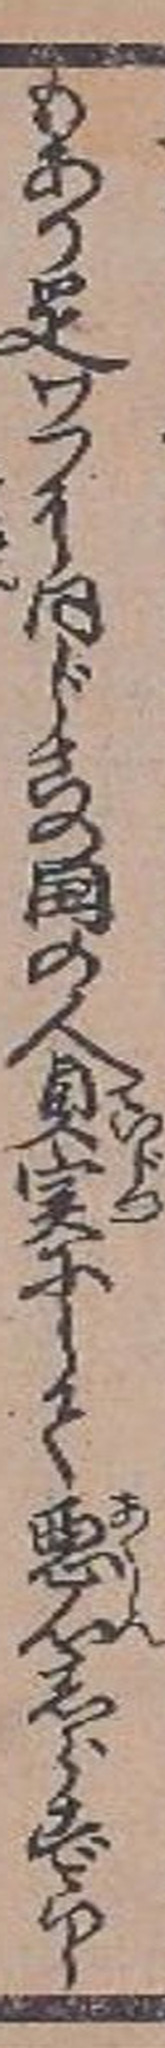もあり是ワフに同じこの国の人貞実にして悪心しらずらし
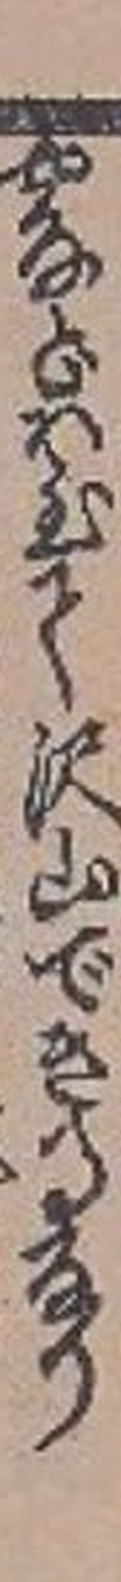やなどは至て沢山できるなり
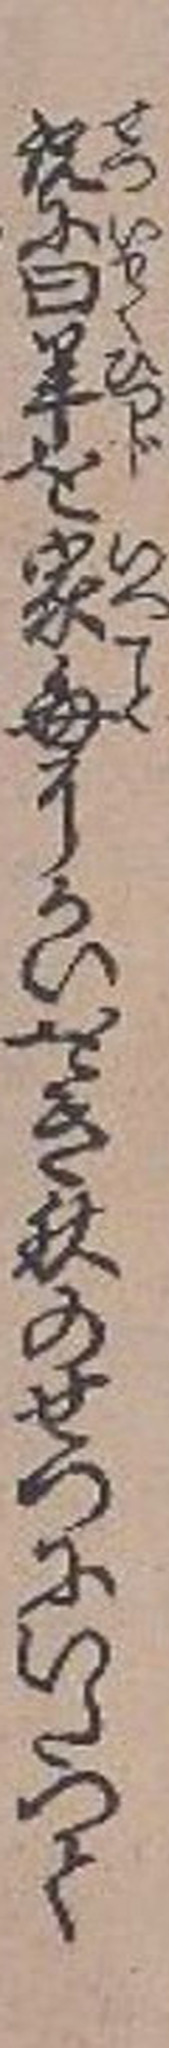説に曰羊を家毎にかひをき秋のせつにいたつて
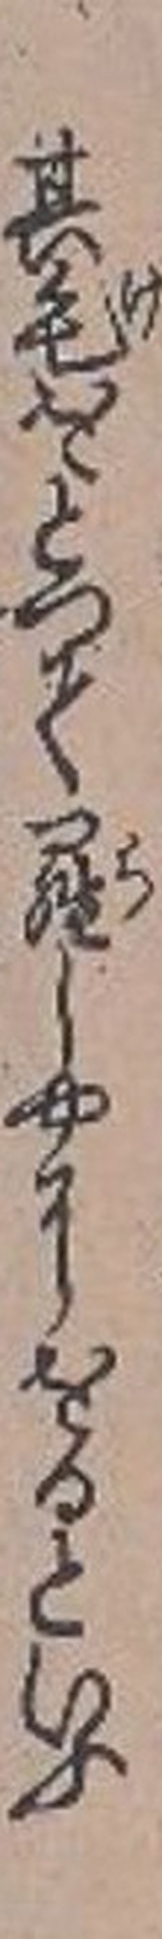其毛をとつて羅しやにをるといふ
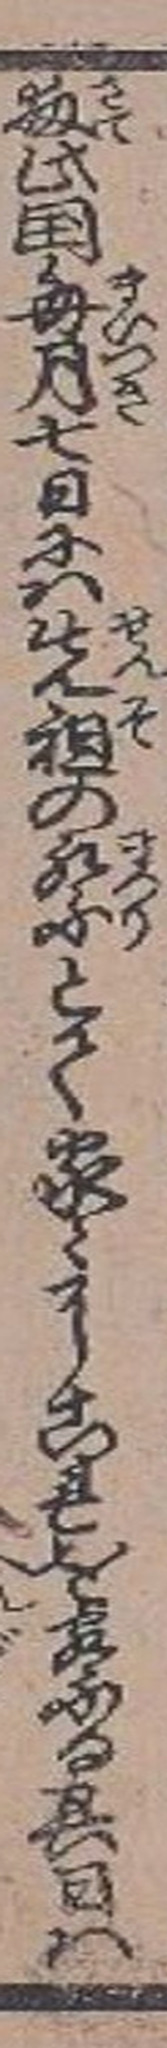扨此国毎月七日に先祖の祭とて家々にこれをふる其日は
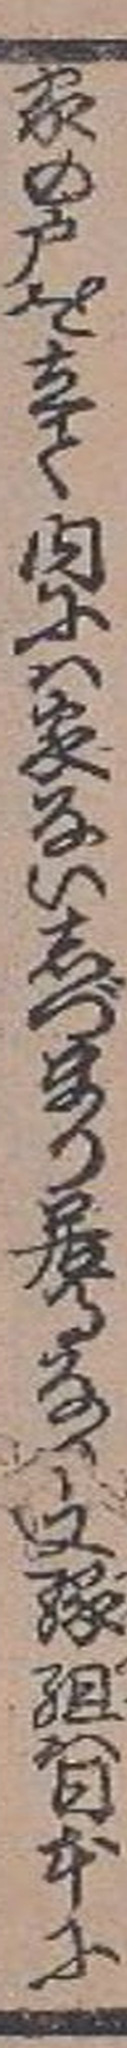家の戸を立て内には家ないしづまり居るなり又縁組は日本に

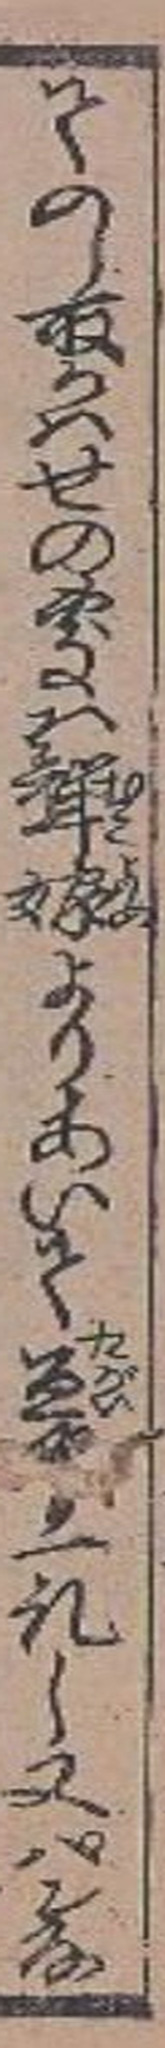てのし取かはせの処は聟嫁よりあいて互一礼し又パンな
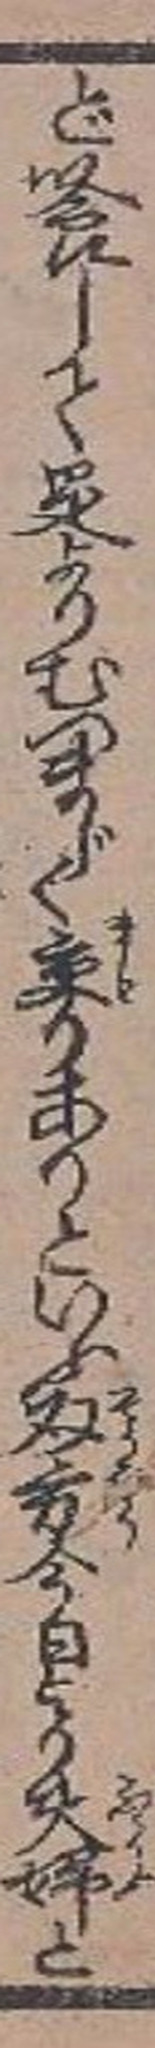ど喰して是よりむつまじく交りありといふ双方今日より夫婦と
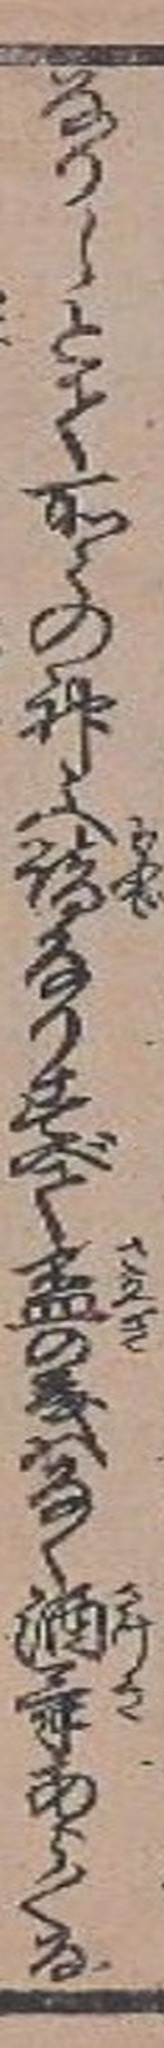なりしとて所々の神々へ詣なりすべて盃の義はなく酒気あらくな
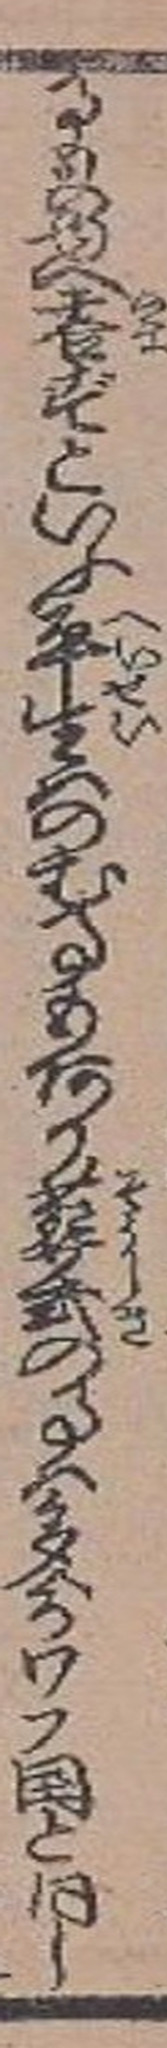るものゆへ呑ずといふ平生はのむ事もあり葬式の事は多分ワフ国と同し
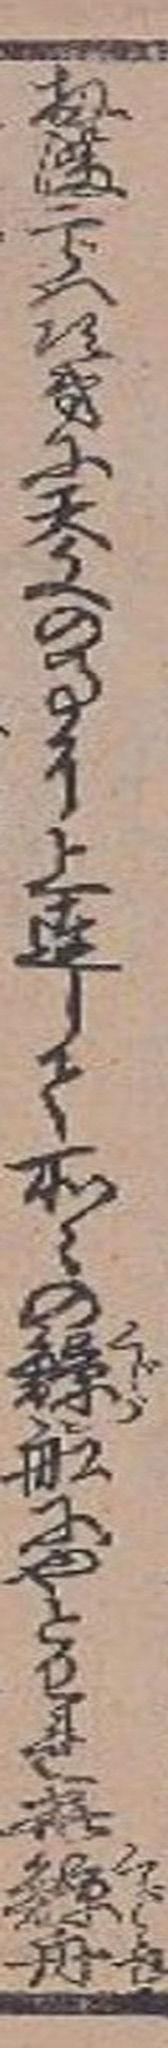扨満二郎は次第に天文の事に上達して所々の鯨船にやとわれ此鯨舟
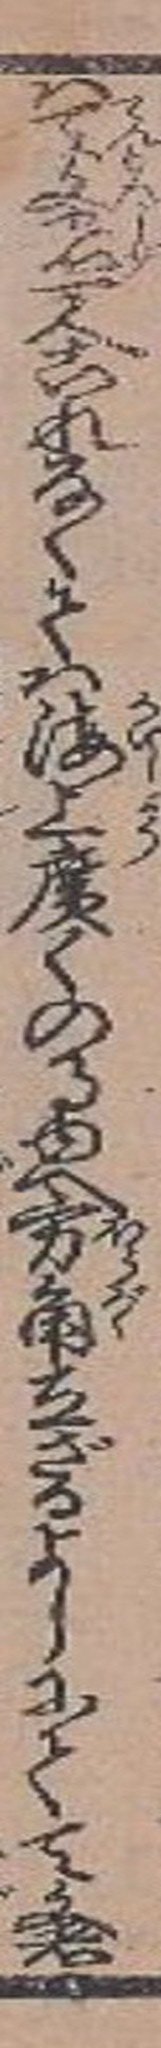は天文者一人これなくては海上広くのるゆへ方角立ざるよしにて天文者
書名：満次郎漂流記
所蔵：University of the Ryukyus Library
